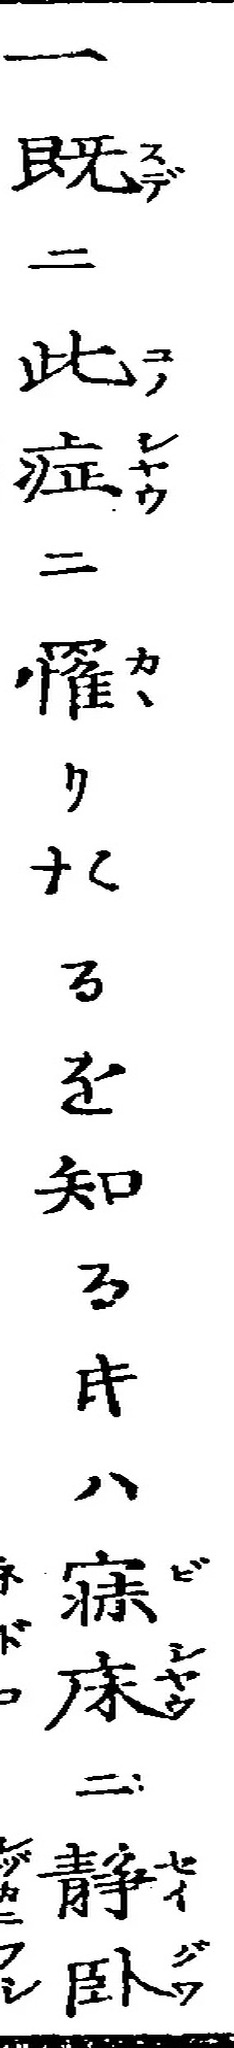一既に此症に罹りたるを知るときは寐床に静臥
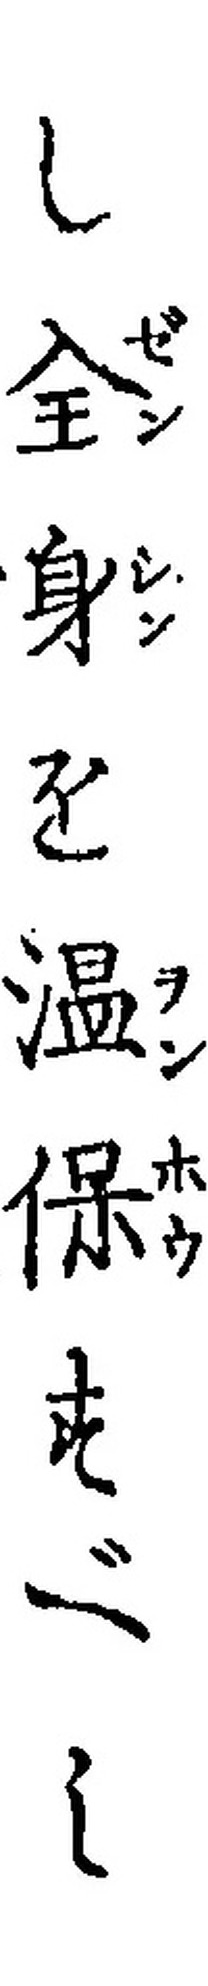し全身を温保すべし
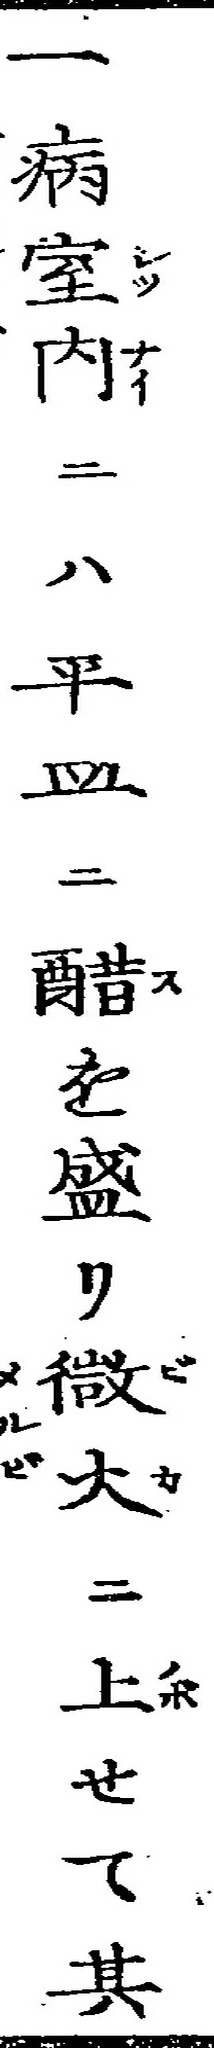一病室内には平皿に醋を盛り微火に上せて其
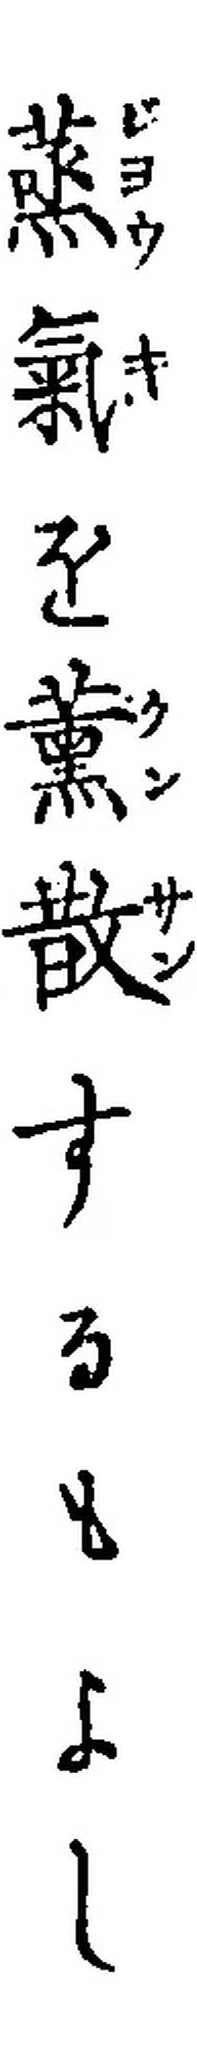蒸気を薫散するもよし
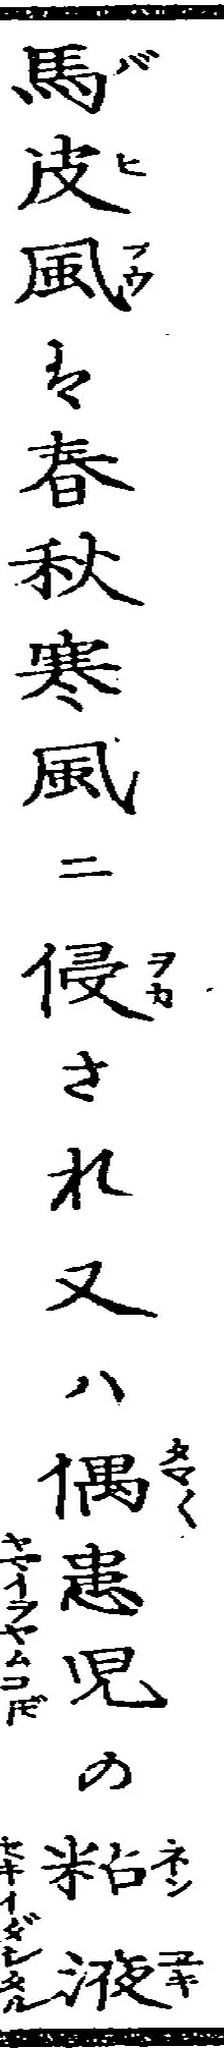馬皮風は春秋寒風に侵され又は偶患児の粘液

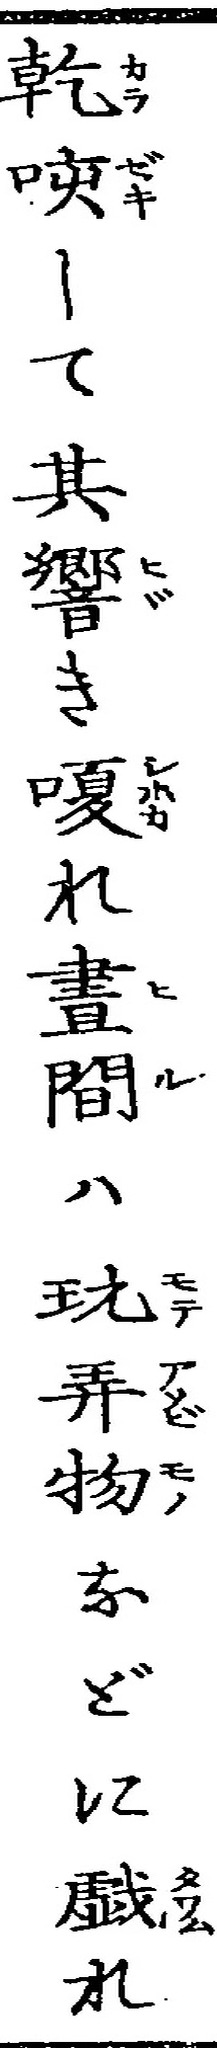空咳して其響き嗄れ昼間は玩弄物などに戯れ
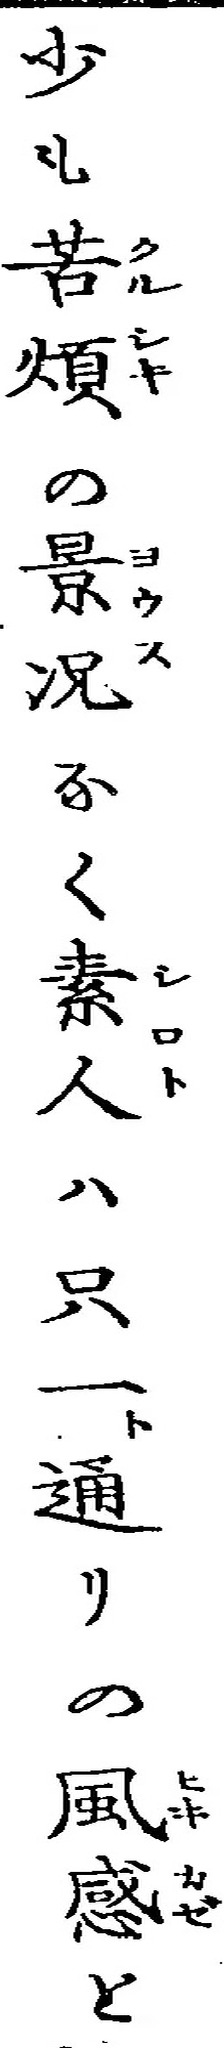少も苦煩の景況なく素人は只一ト通りの風感と
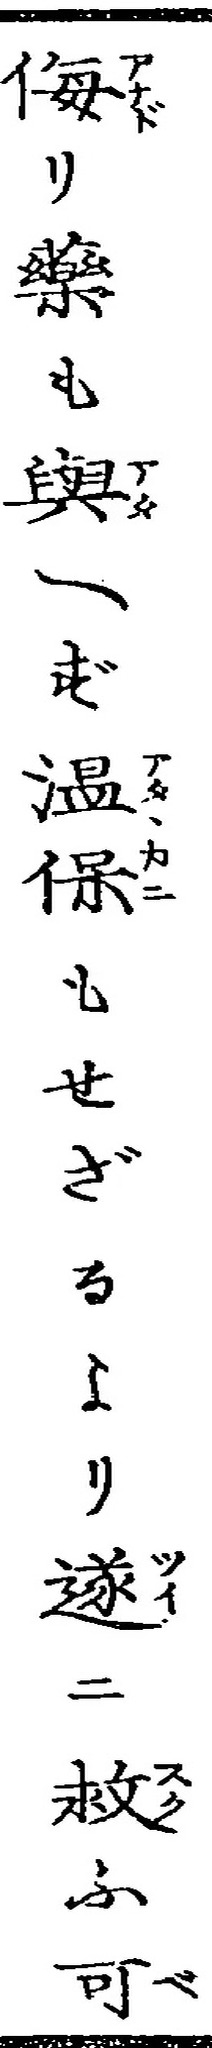侮り藥も与へず温保もせざるより遂に救ふ可
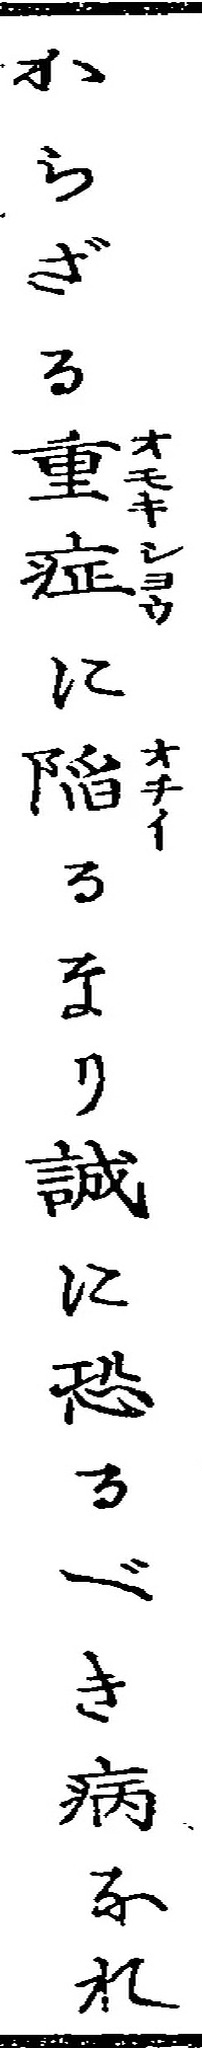からざる重症に陥るなり誠に恐るべき病なれ
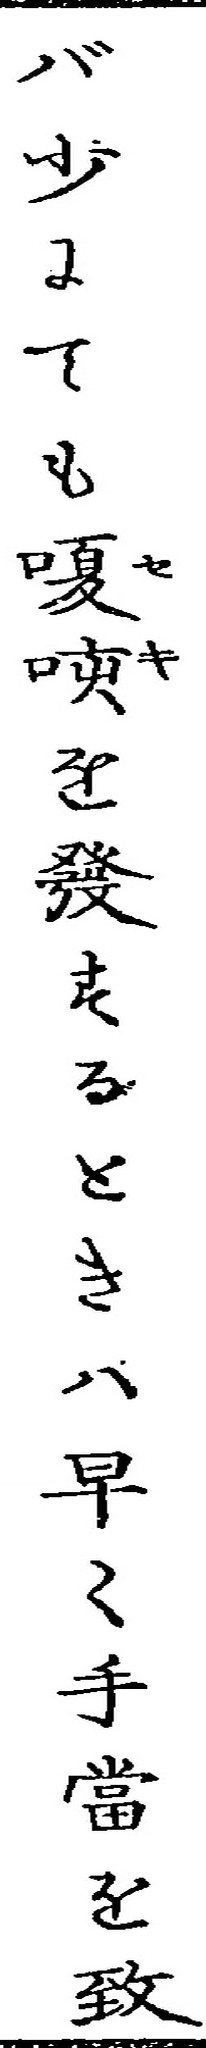ば少にても嗄咳を発するときは早く手当を致
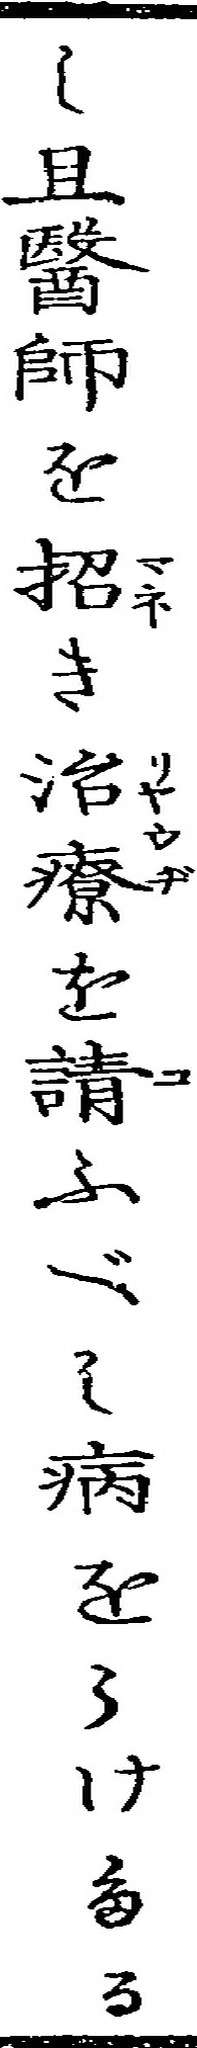し且医師を招き治療を請ふべし病をうけたる
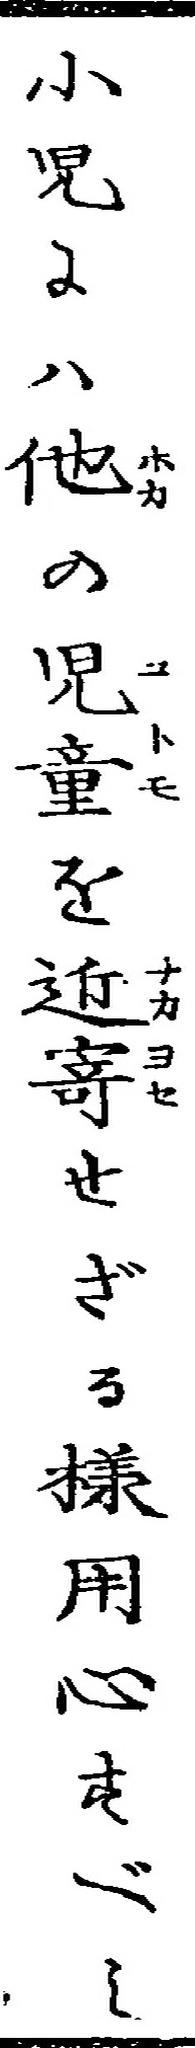小児には他の児童を近寄せざる様用心すべし
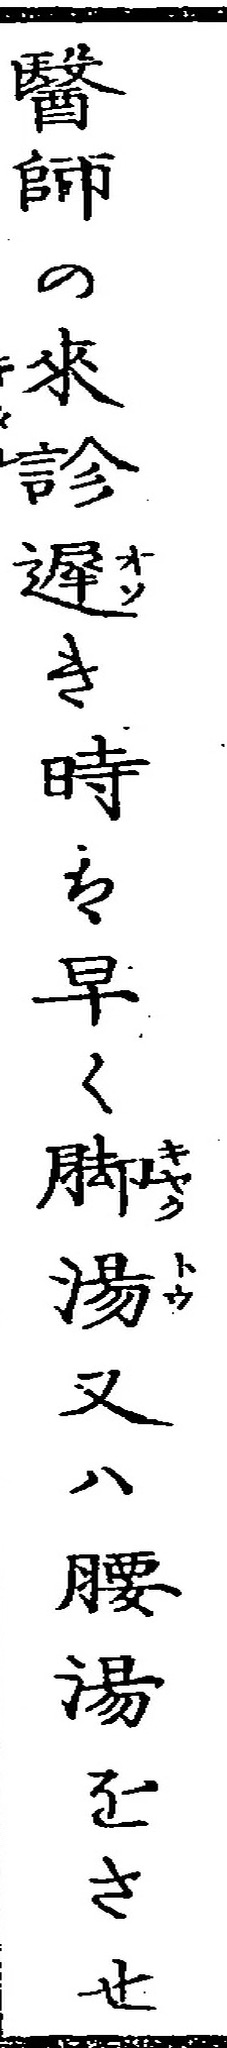医師の来診遅き時は早く脚湯又は腰湯をさせ
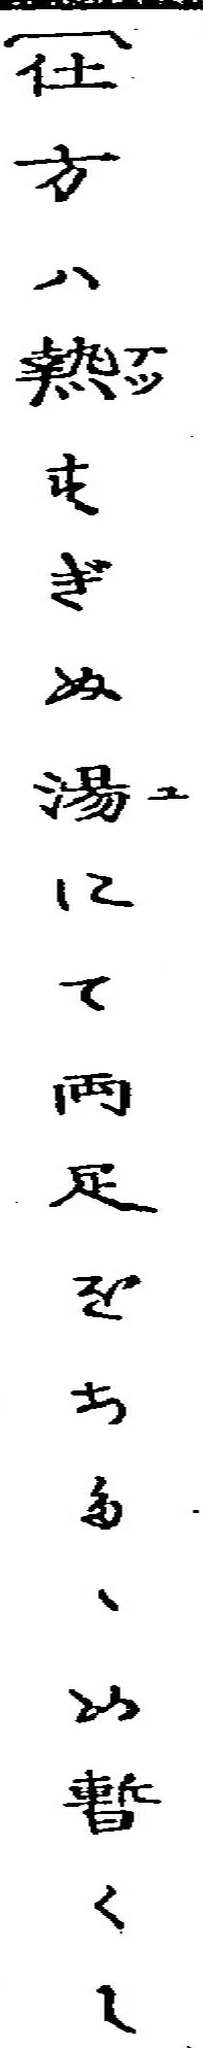[仕方は熱すぎぬ湯にて両足をあたゝめ暫くし
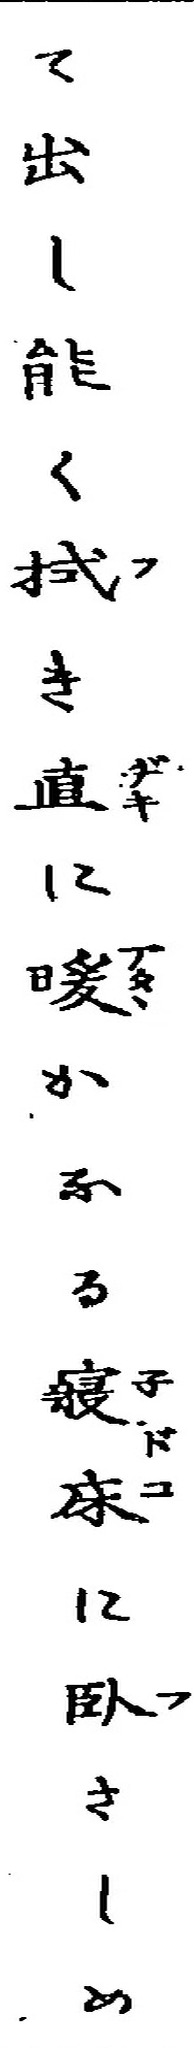て出し能く拭き直に暖かなる寝床に臥さしめ
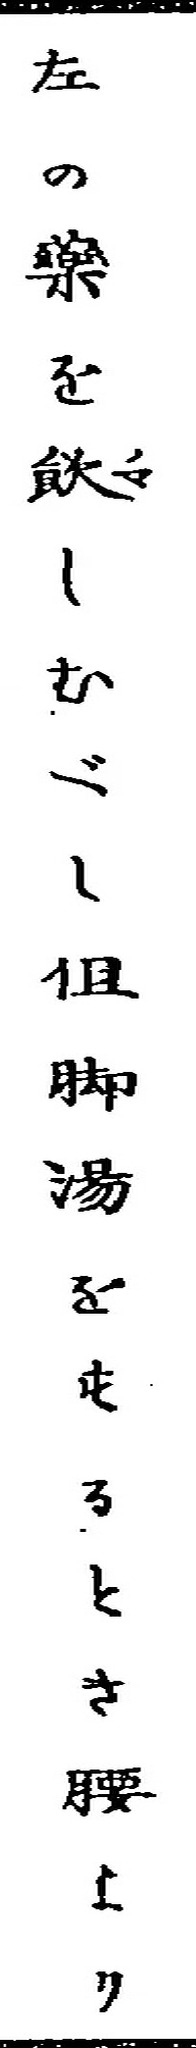左の薬を飲しむべし但脚湯をするとき腰より
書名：伝染病予防法
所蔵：国立国会図書館 National Diet Library, JAPAN
